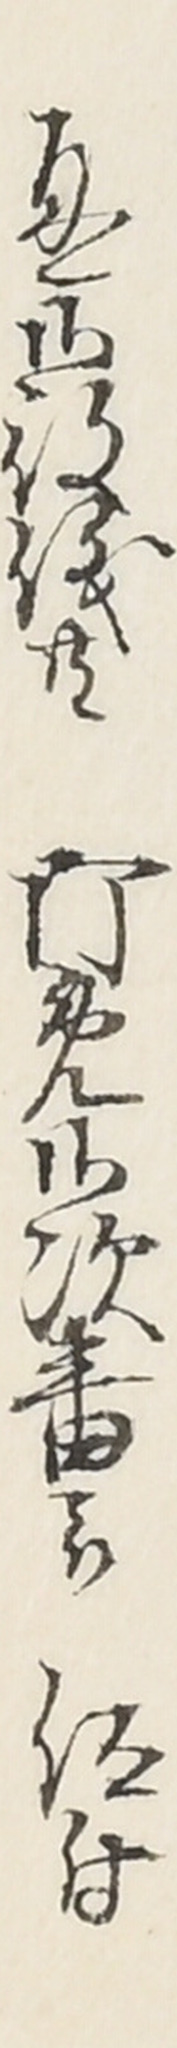通御役儀共御免御次番被仰付
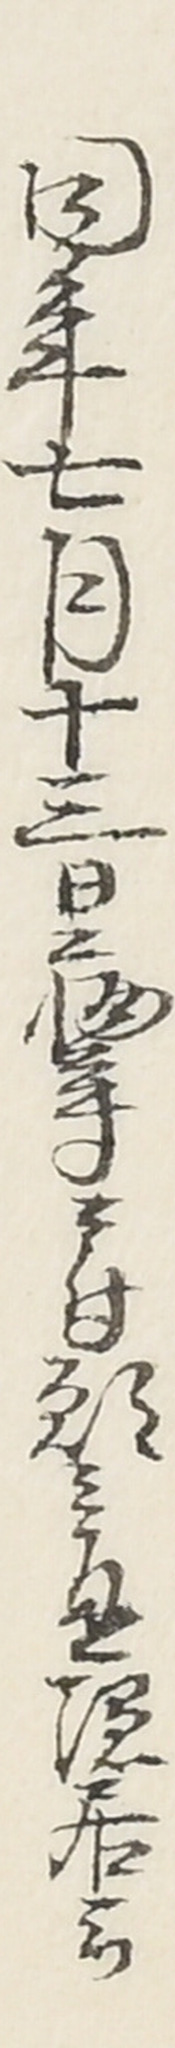一同年七月十三日病気ニ付願之通隠居被
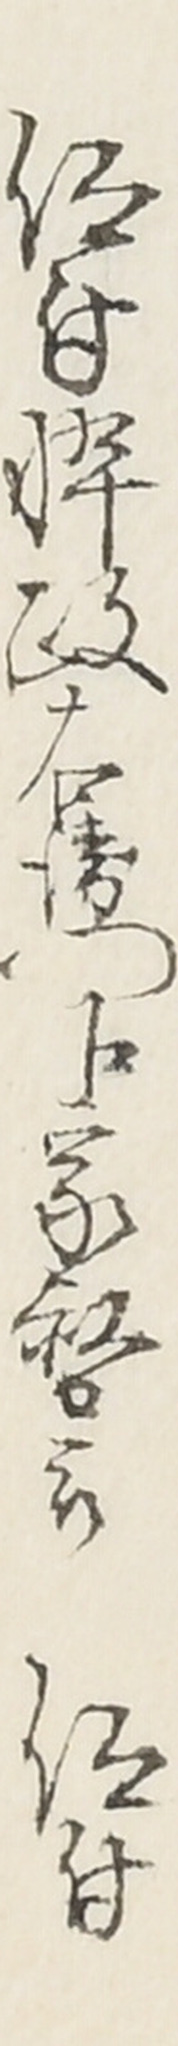仰付忰政右衛門江家督被仰付

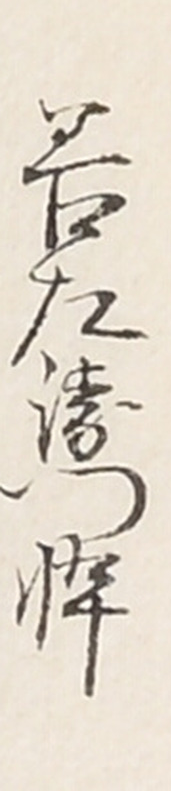善左衛門忰
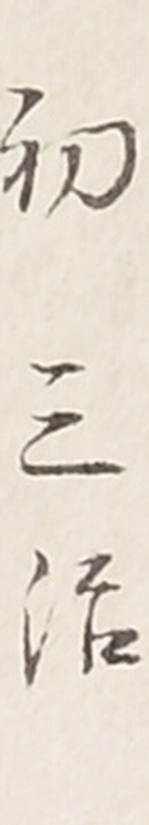初三治
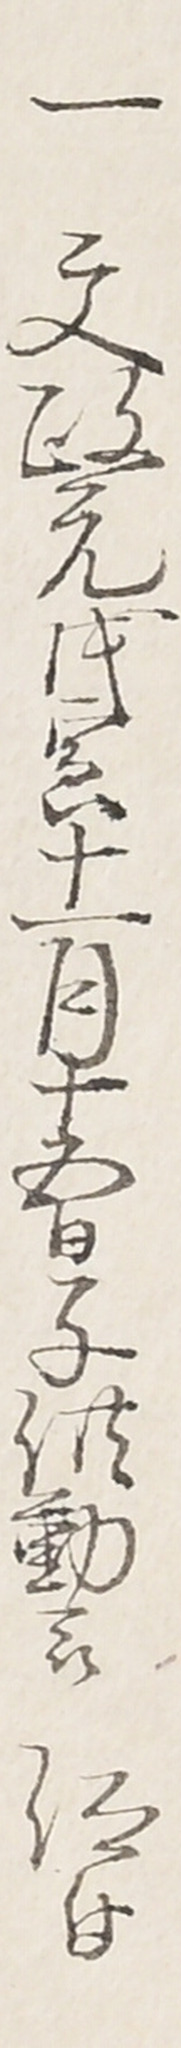一文政元戊寅十一月十五日子供勤被仰付
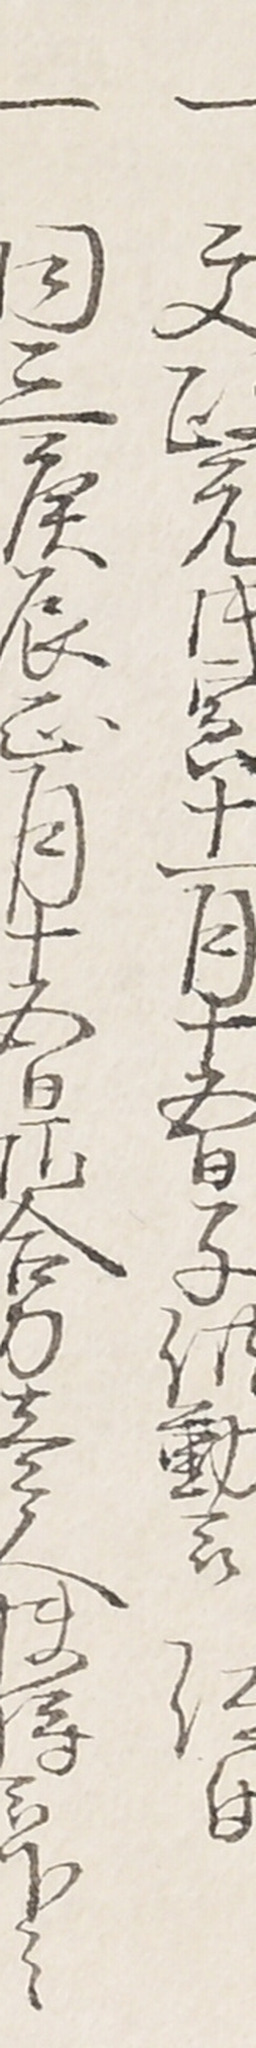一同三庚辰正月十五日御合力壱人扶持被下之
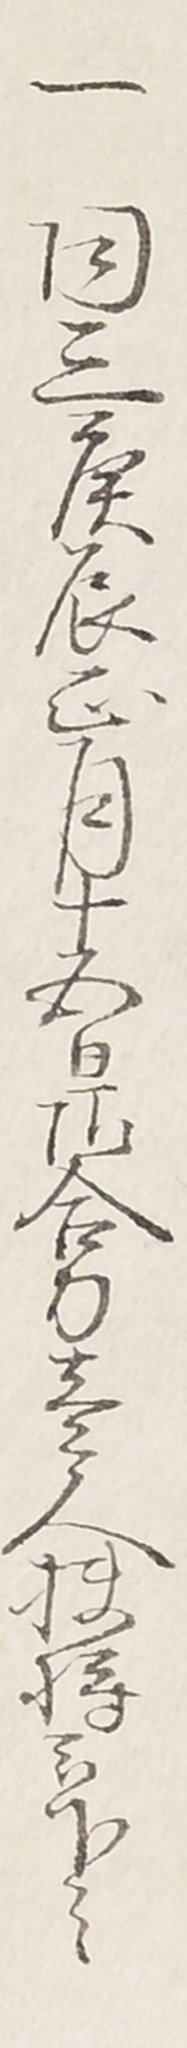一同三庚辰正月十五日御合力壱人扶持被下之
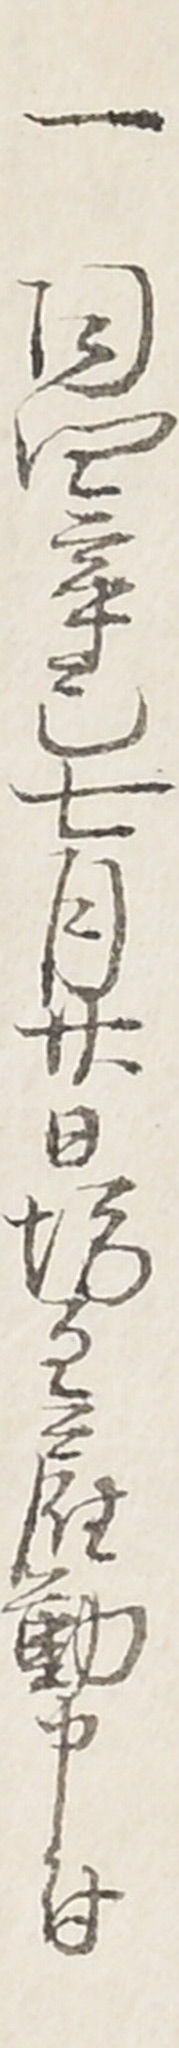一同四辛巳七月廿日坊主雇勤申付
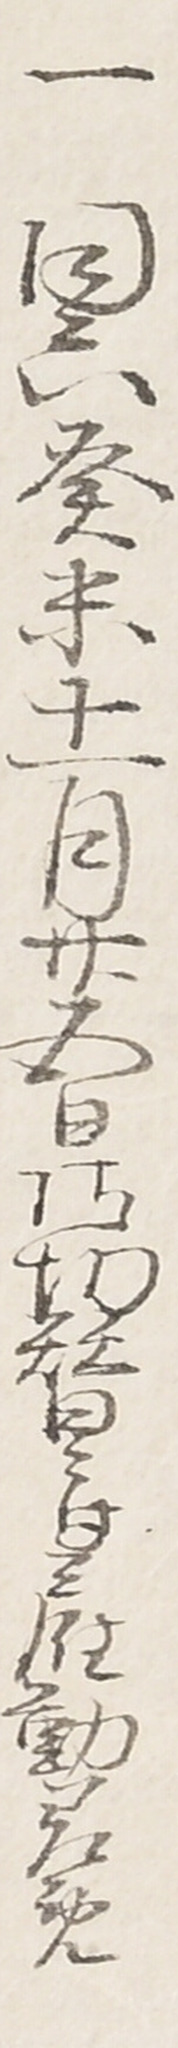一同六癸未十一月廿五日御切替ニ付雇勤差免
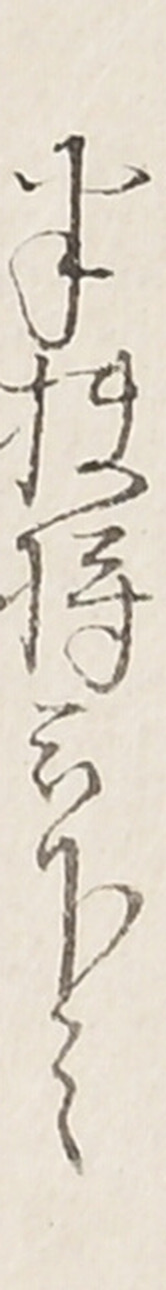半扶持被下之
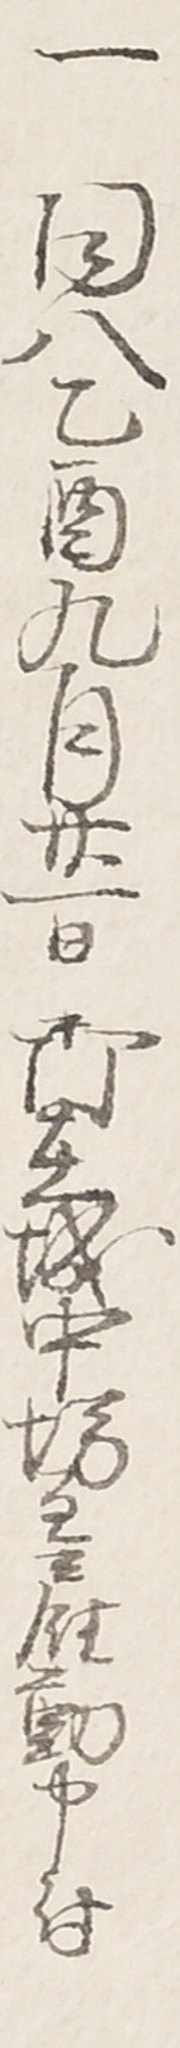一同八乙酉九月廿一日御在城中坊主雇勤申付
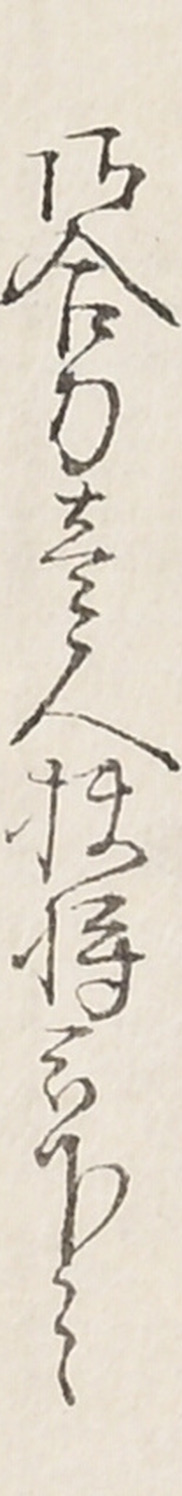御合力壱人扶持被下之
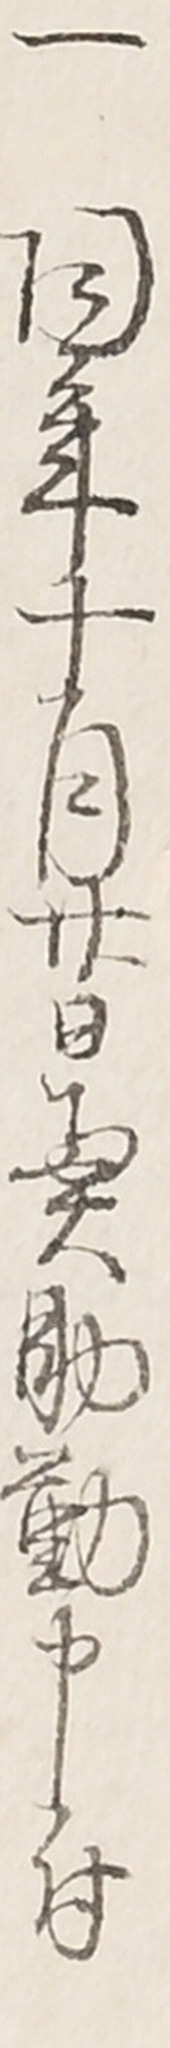一同年十月廿日奥助勤申付
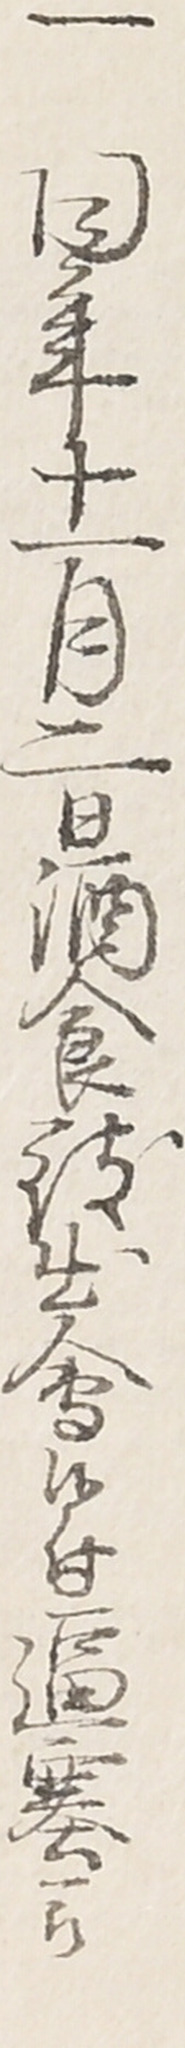一同年十一月二日酒食致出会候付逼塞被
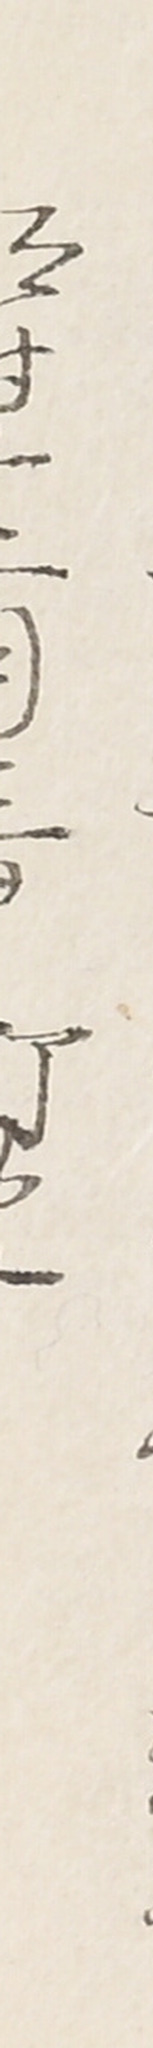仰付十二月三日御免
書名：無足諸士勤仕録（四）
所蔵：伊那市立高遠町図書館・合同会社AMANE
